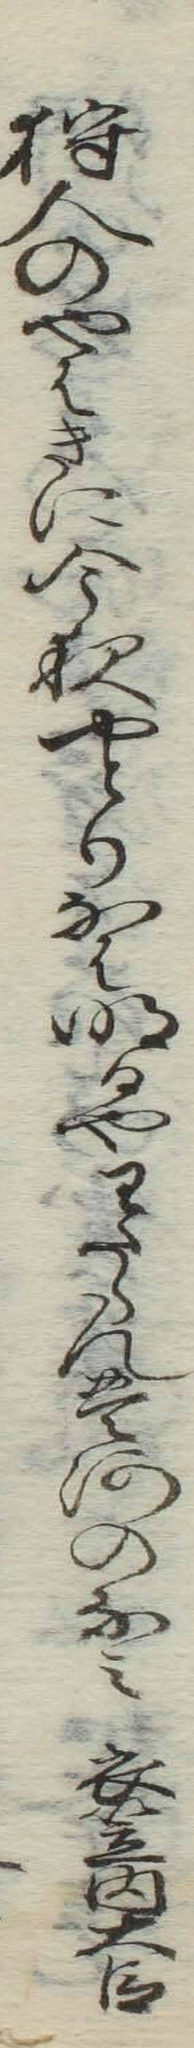同狩人のやはきに今夜やとりなは明る日やわたらん豊河のなみ衣笠内大臣
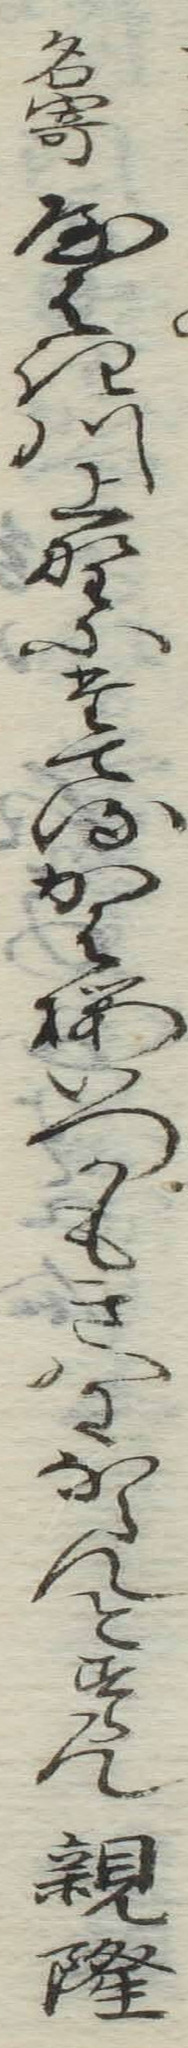名寄やはき川上野にたてるかは桜いつかもきはにならんとすらん親隆
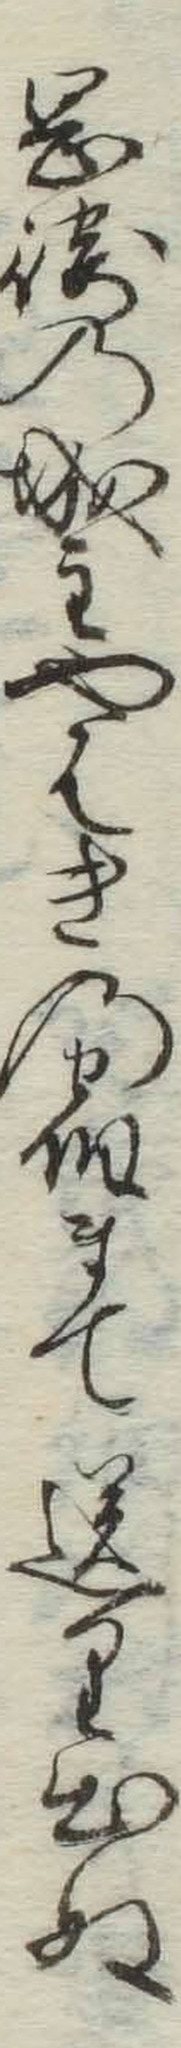岡崎の城主やはきの宿まて送り出ぬ
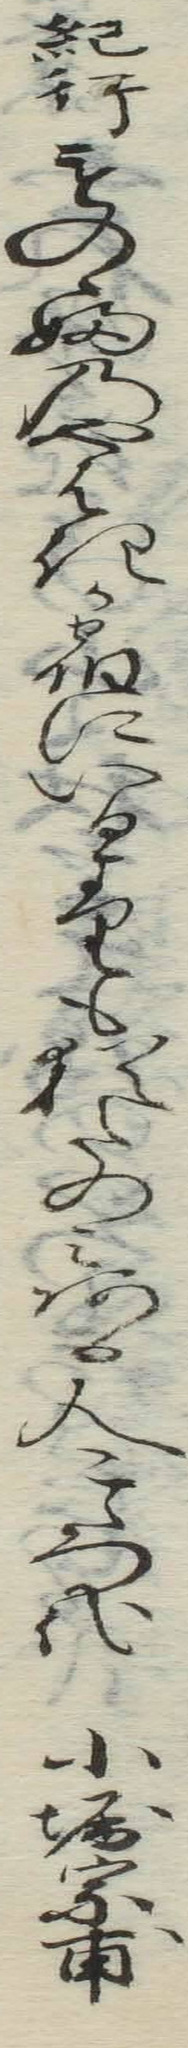紀行ものゝふのやはきか宿にいるよりも猶たのみある人こゝろ哉小堀宗甫
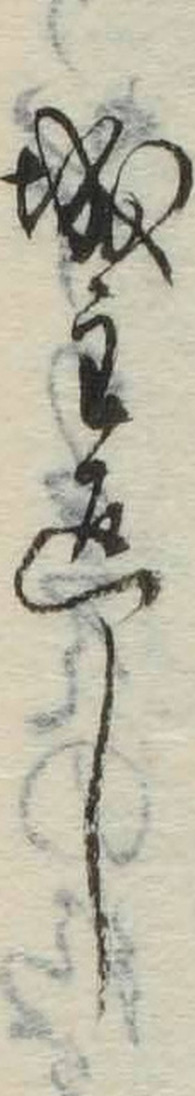城主返し
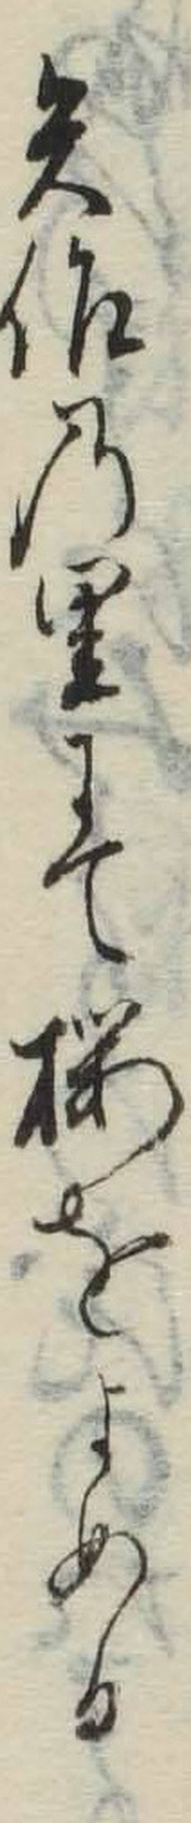矢作の里にて桜をよめる
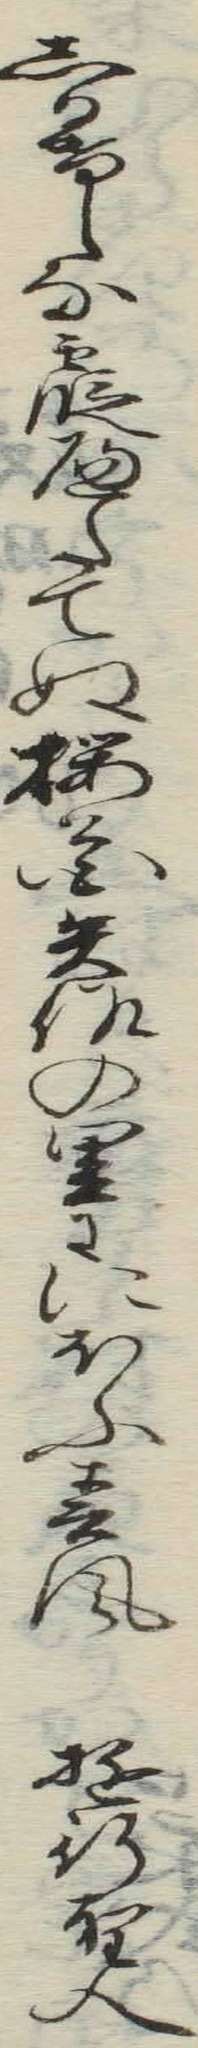しるけしな霞へたてぬ桜花矢作の里ににほふ春風遊行聖人
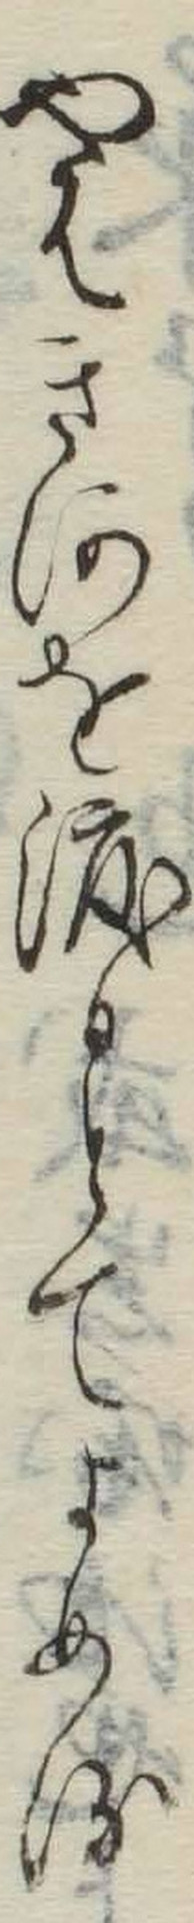やはき河を渡るとてよめる
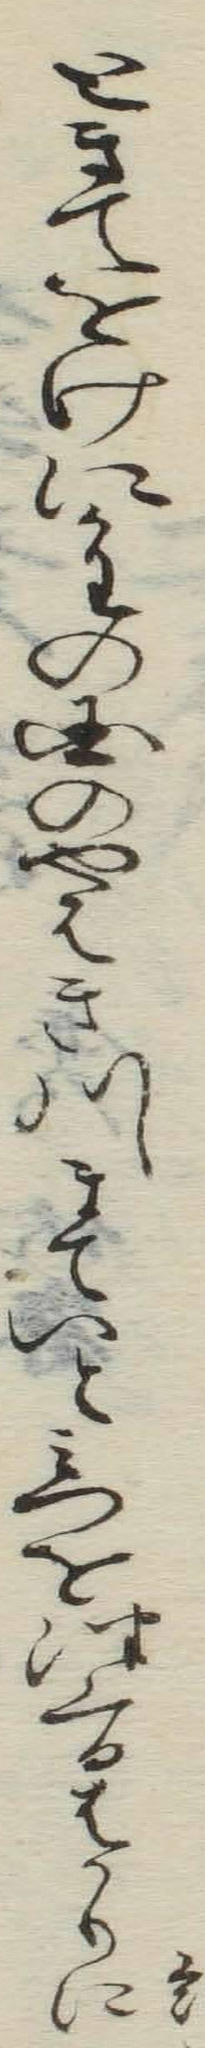ときてをけにかわの国のやはき川まていとみつをつくるはかりに細川幽斎
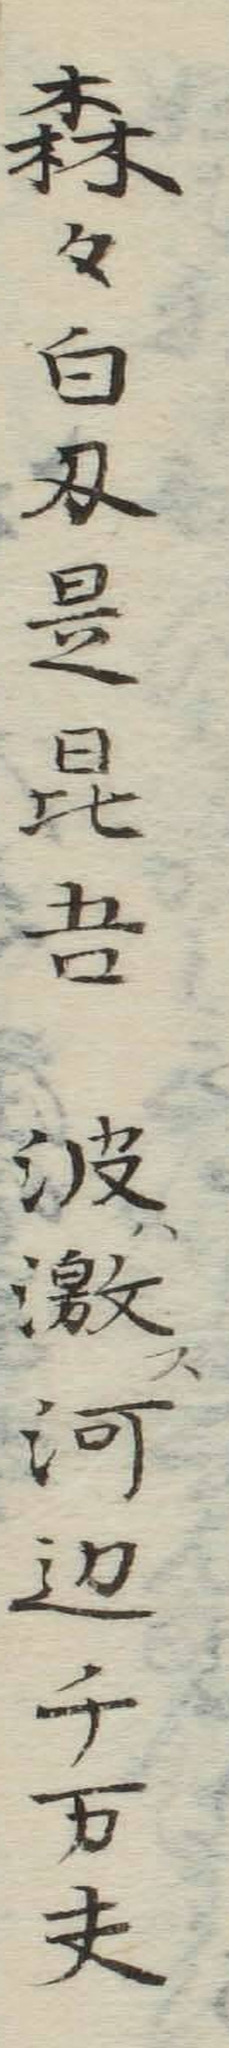森々白刃是昆吾波激河辺千万夫
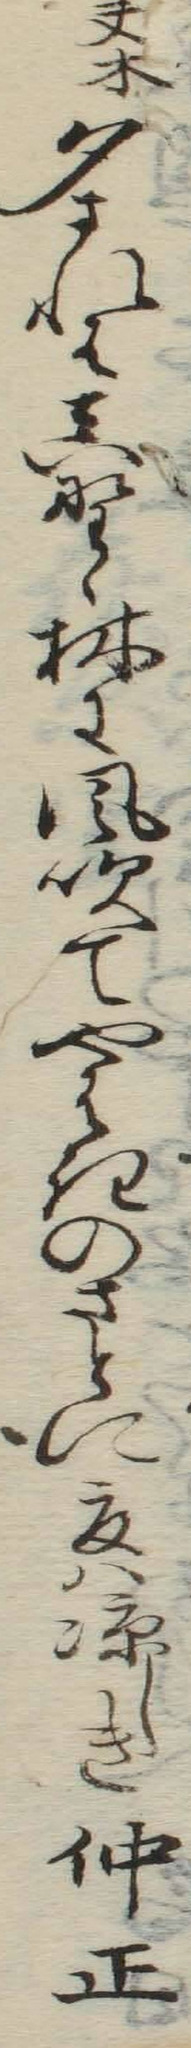夫木夕されは真野ゝ林に風吹てやはきのさとに夏は涼しき仲正

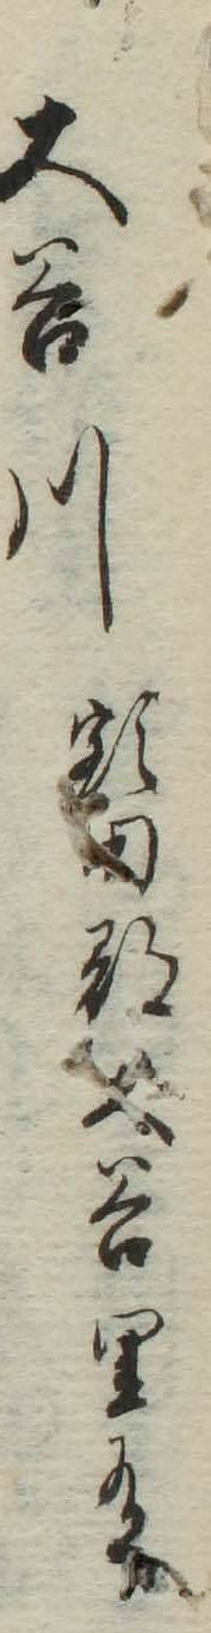大谷川額田郡大谷里有
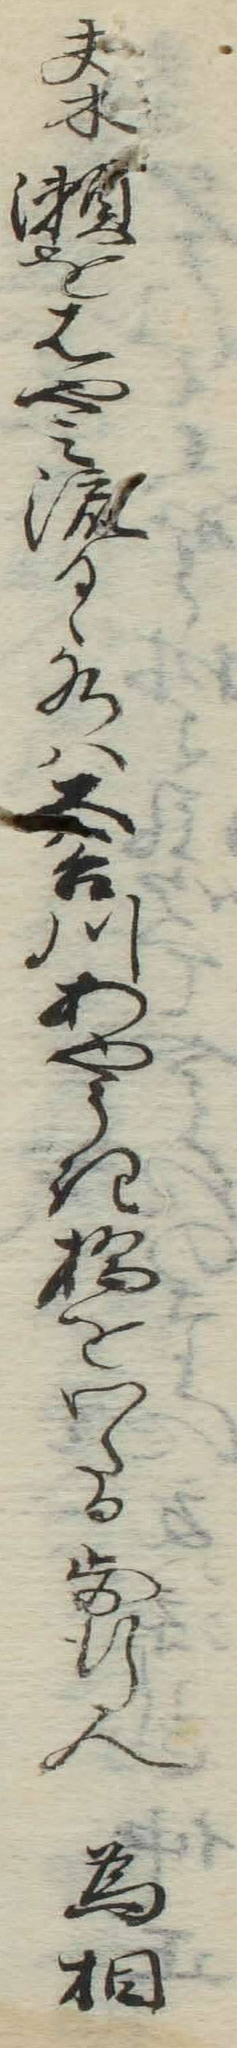夫木瀬をはやみ渡るゝ水は大谷川あやうき橋をわたる歩行人為相
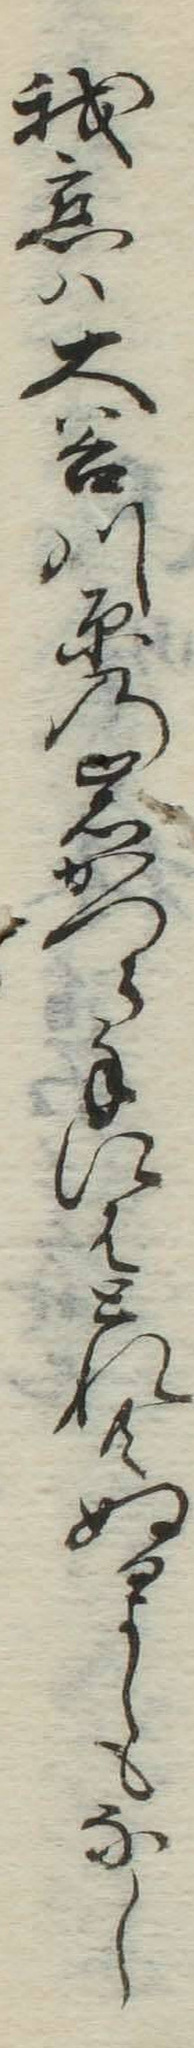我恋は大谷川原の岩かつら手にはとれ共ぬるよしもなし
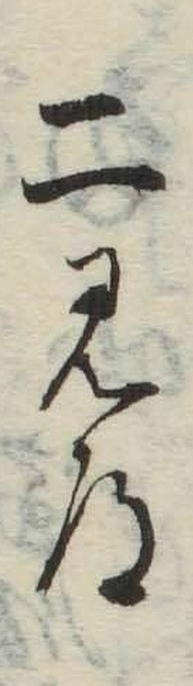二見道

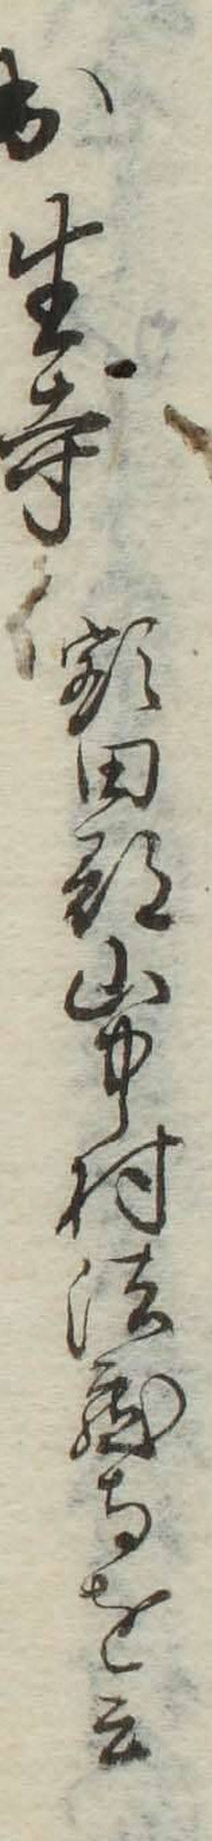出生寺額田郡山中村法蔵寺を云
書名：三河国二葉松
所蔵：国文学研究資料館
